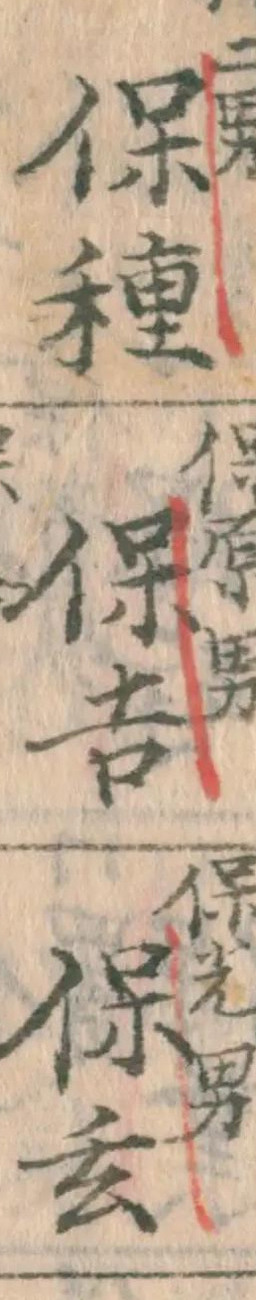保種保𠮷保玄
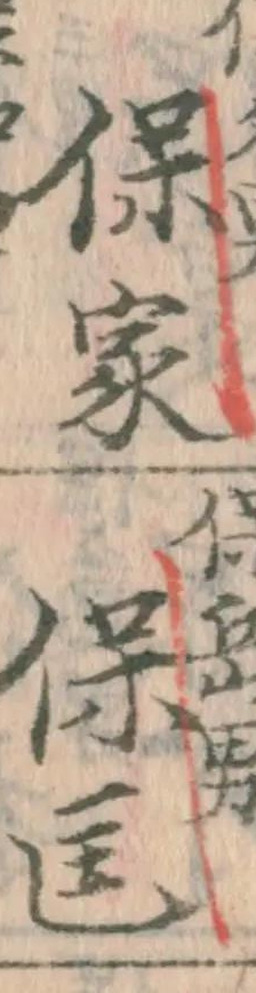保家保匡
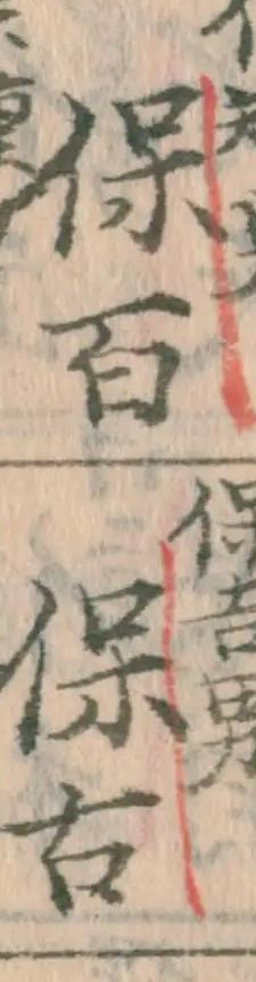保百保古
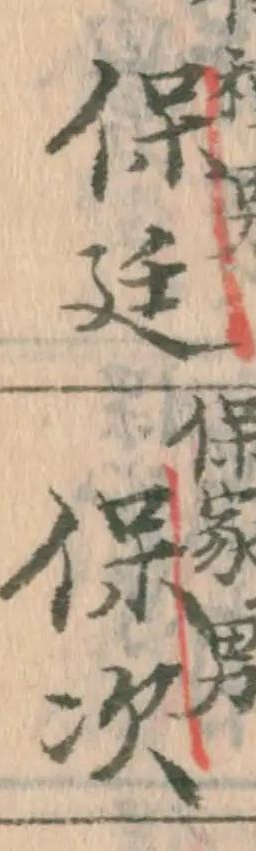保廷保次
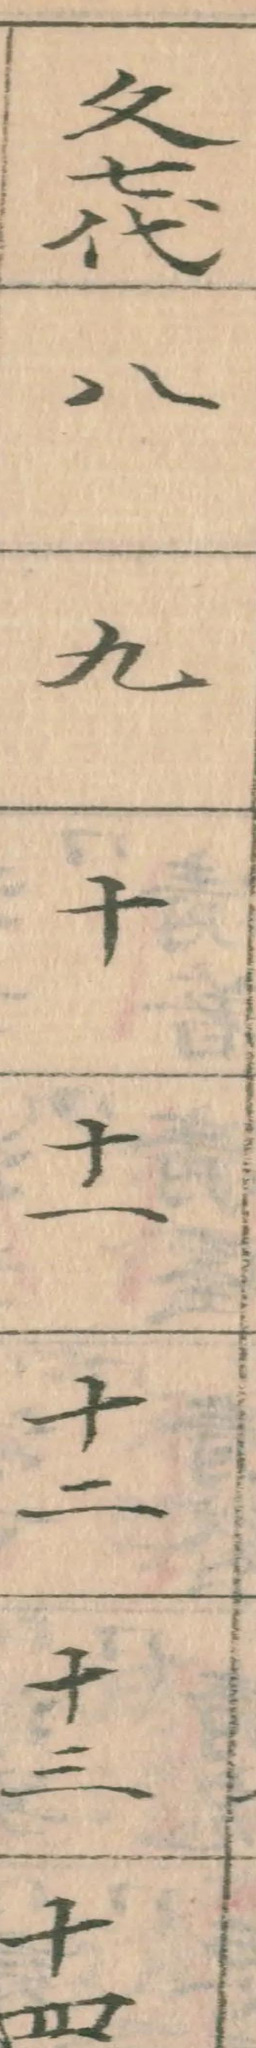久七代八九十十一十二十三十四
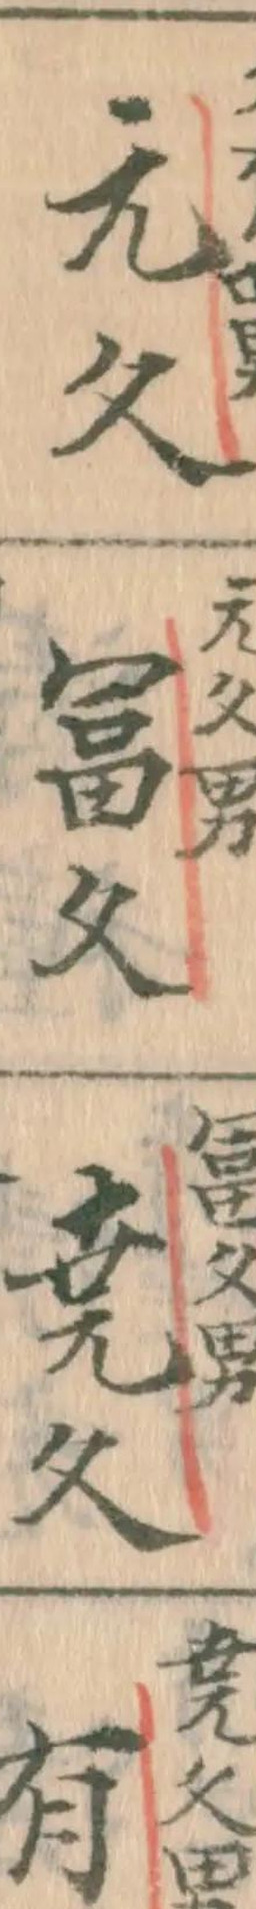元久冨久尭久有久
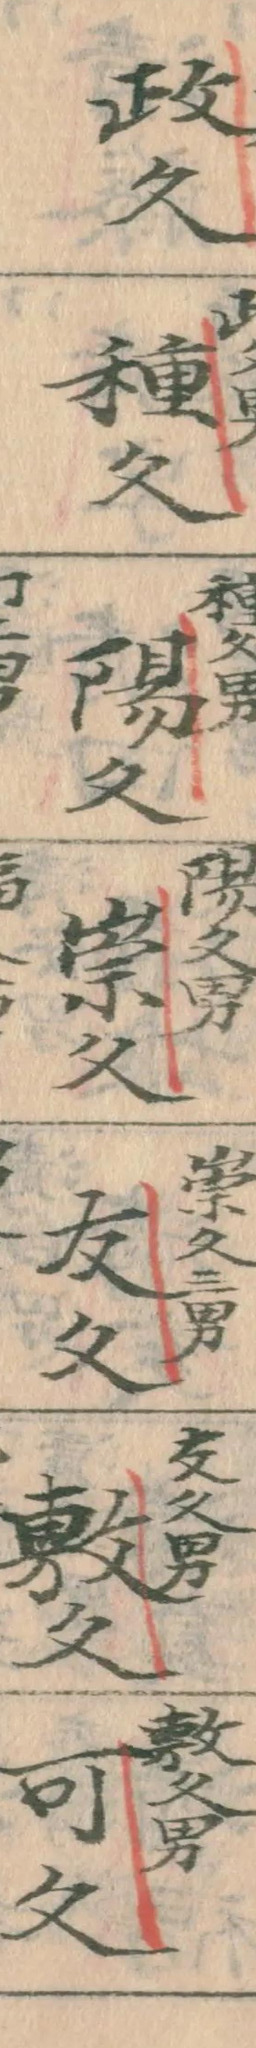政久種久陽久崇久友久敷久可久
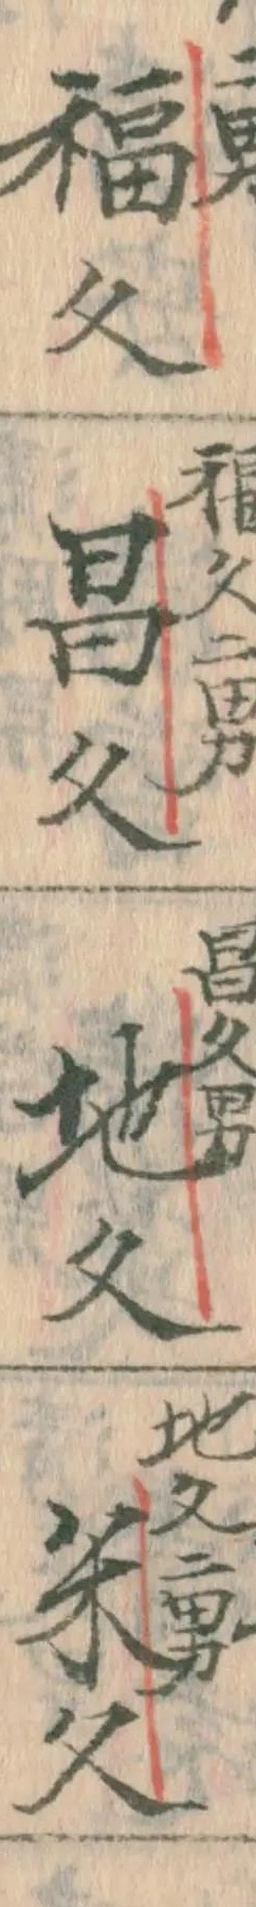福久昌久地久米久

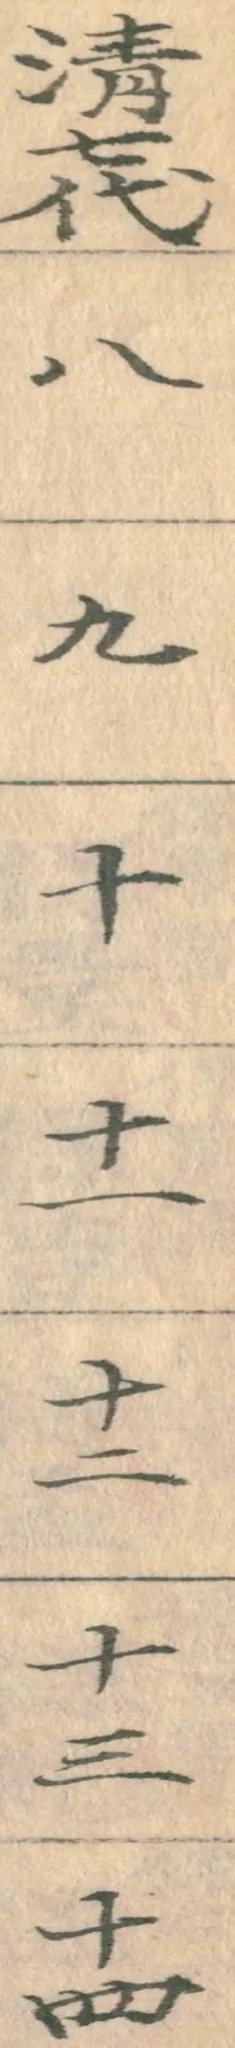清七代八九十十一十二十三十四
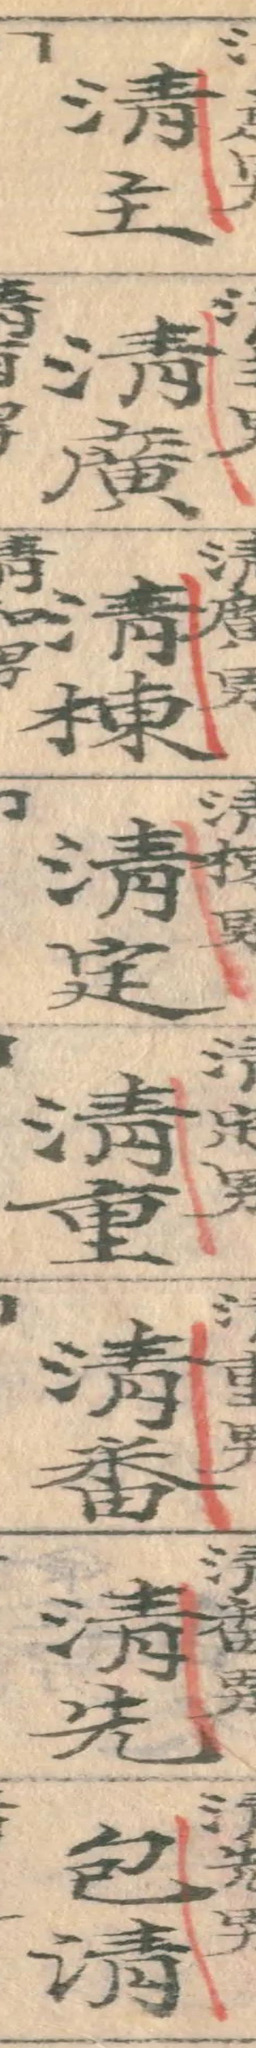清主清広清棟清定清重清番清先包清
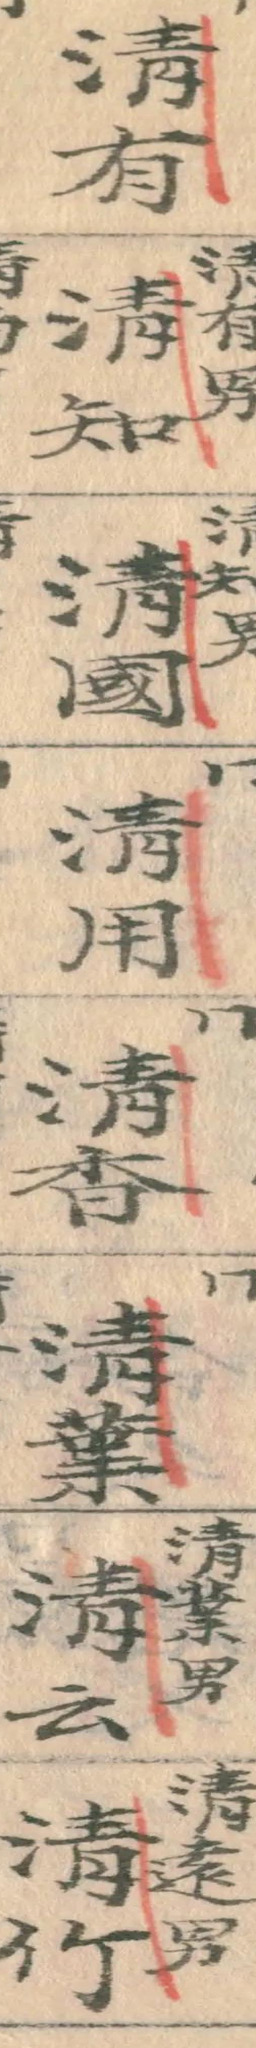清有清知清国清用清香清葉清云清竹
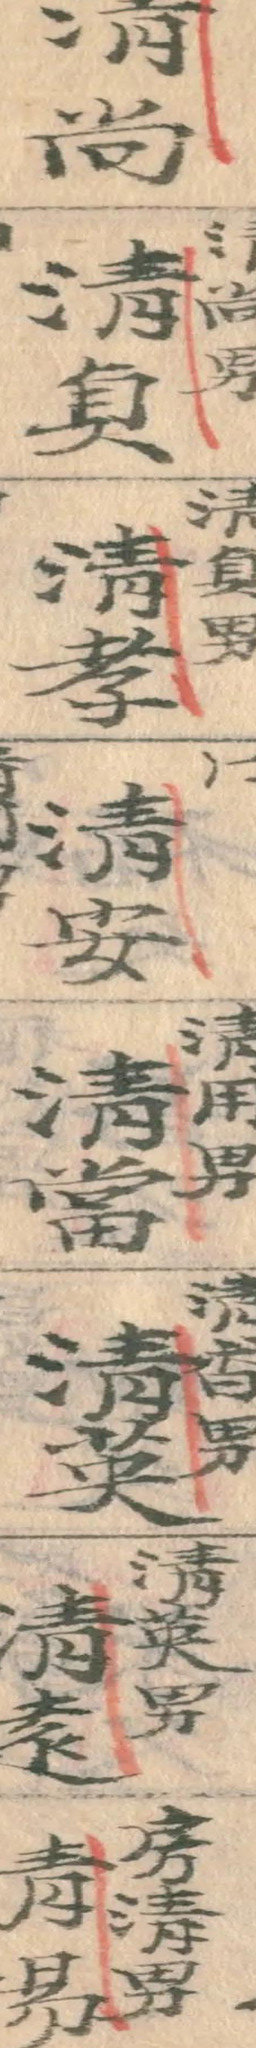清尚清貞清孝清安清当清英清遠清揚
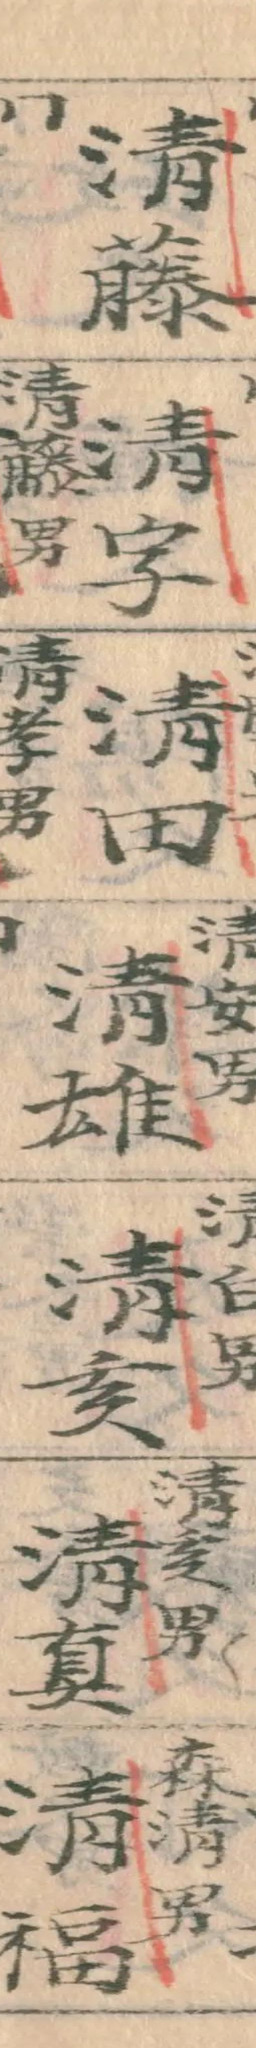清藤清字清田清雄清亥清真清福
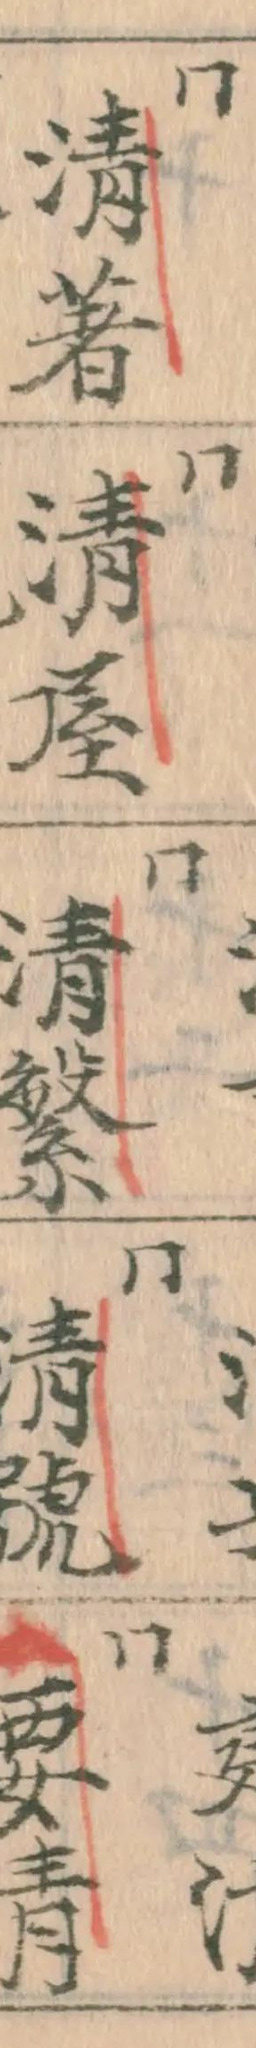清著清屋清繁清号▲要清
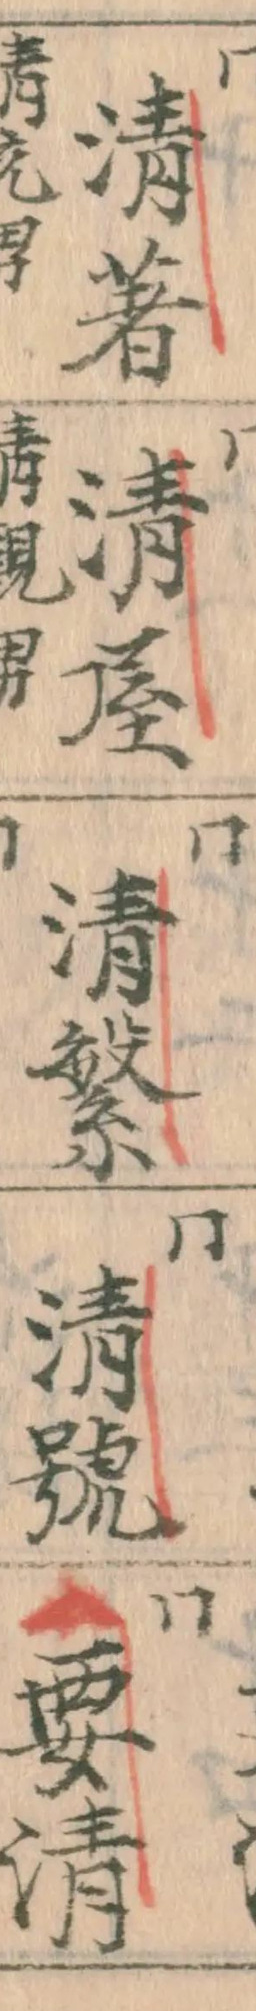清著清屋清繁清号▲要清
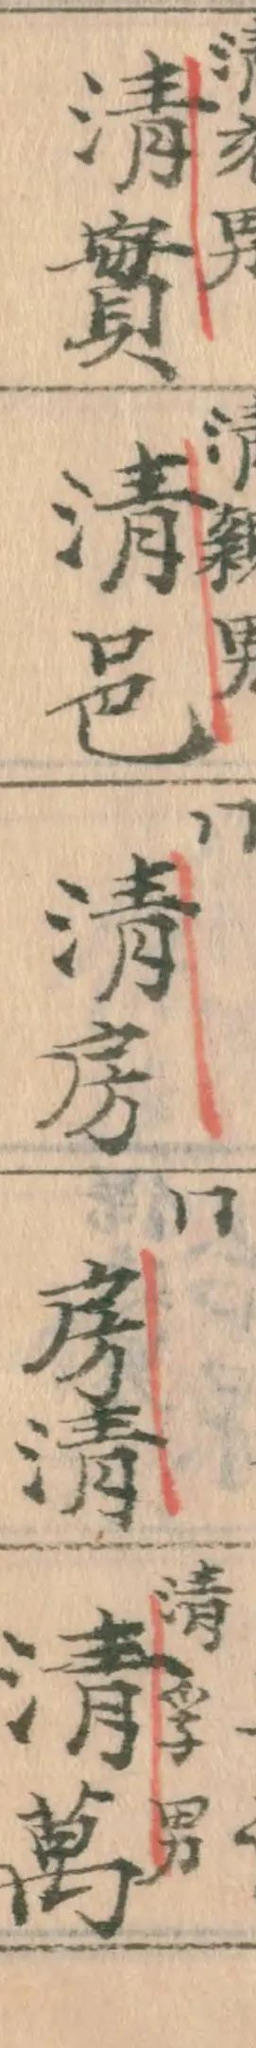清実清邑清房房清清万
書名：賀茂社記録. 第24冊
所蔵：国立国会図書館 National Diet Library, JAPAN
